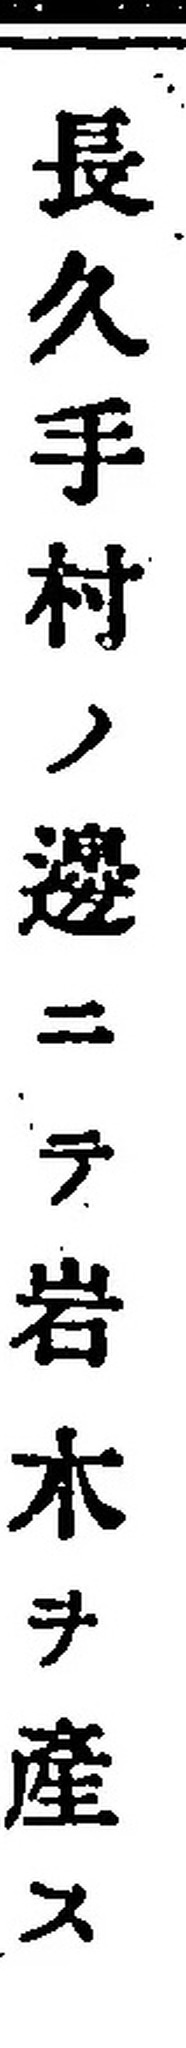物產長久手村ノ邊ニテ岩木ヲ產ス
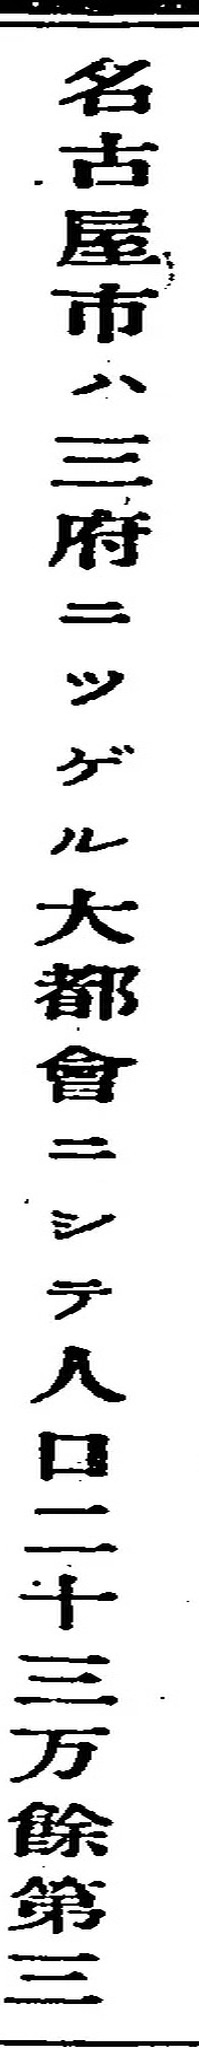名古屋市名古屋市ハ三府ニツゲル大都會ニシテ人口二十三万餘第三
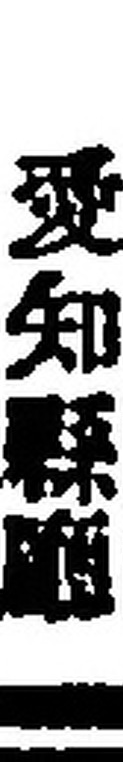愛知縣廳
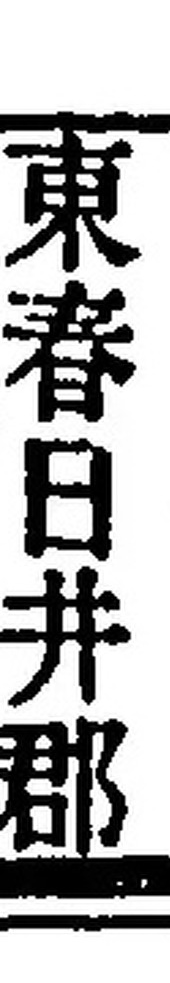東春日井郡
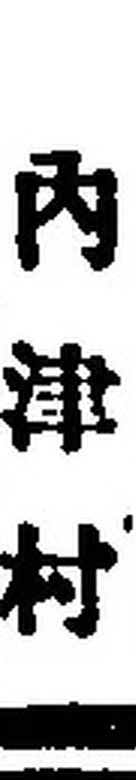赤津村
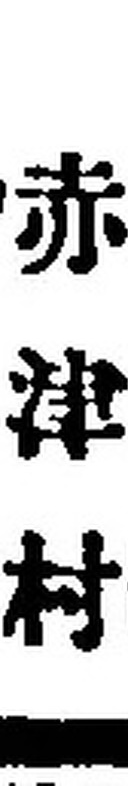赤津村
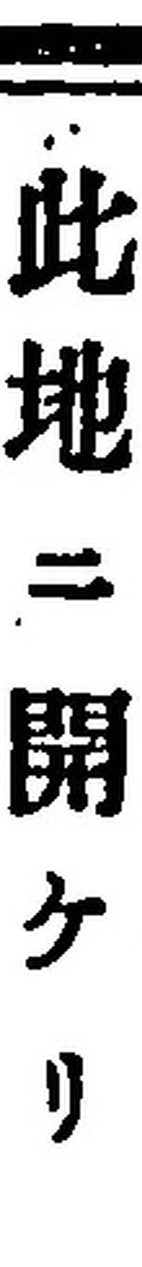此地ニ開ケリ
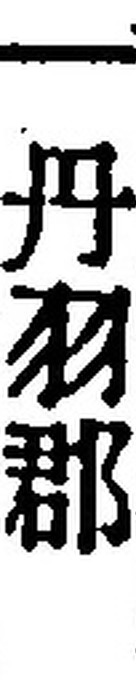丹羽郡
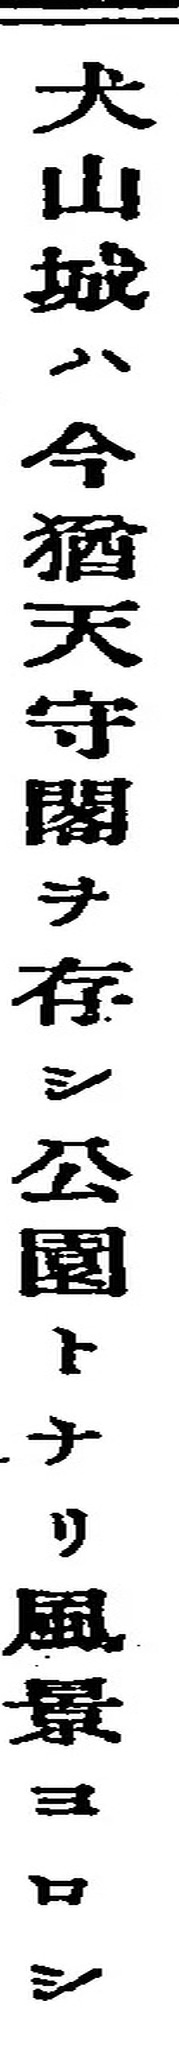犬山城犬山城ハ今猶天守閣ヲ存シ公園トナリ風景ヨロシ

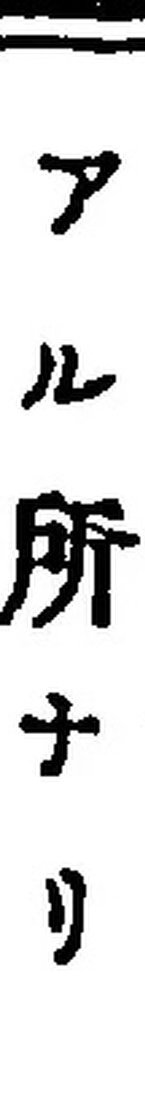アル所ナリ
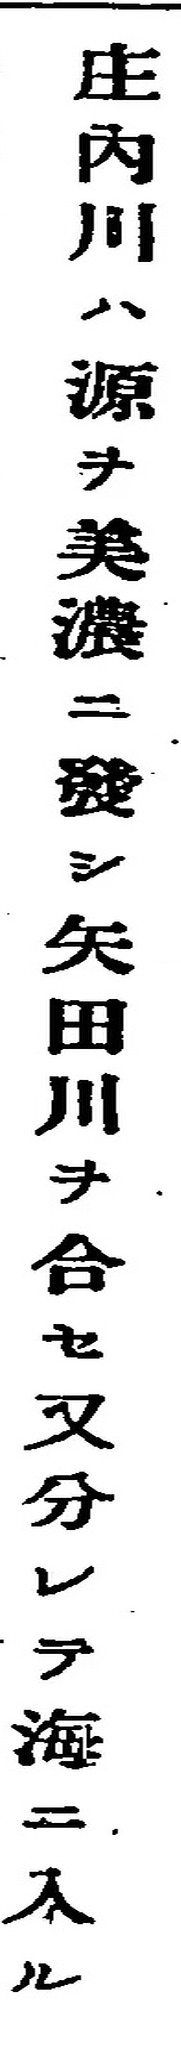庄内川庄内川ハ源ヲ美濃ニ發シ矢田川ヲ合セ又分レテ海ニ入ル
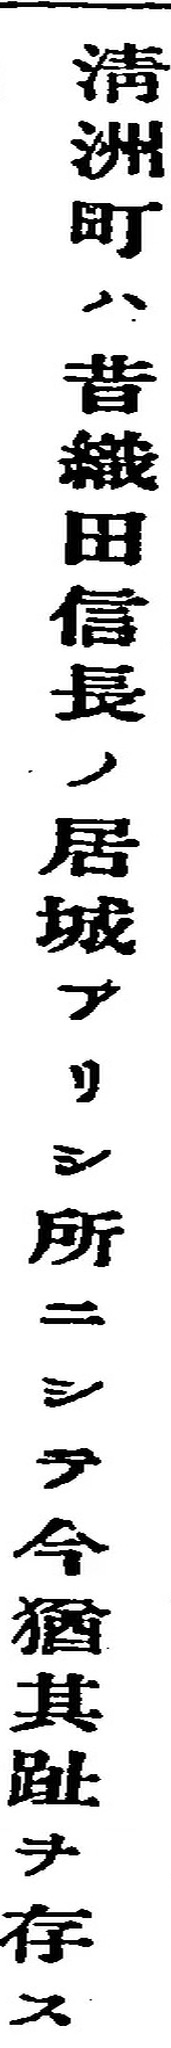淸洲町淸洲町ハ昔織田信長ノ居城アリシ所ニシテ今猶其趾ヲ存ス
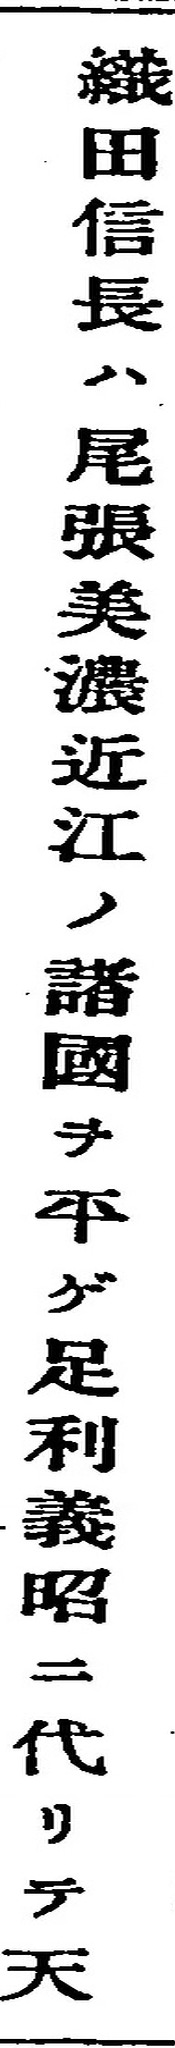織田信長織田信長ハ尾張美濃近江ノ諸國ヲ平ゲ足利義昭ニ代リテ天
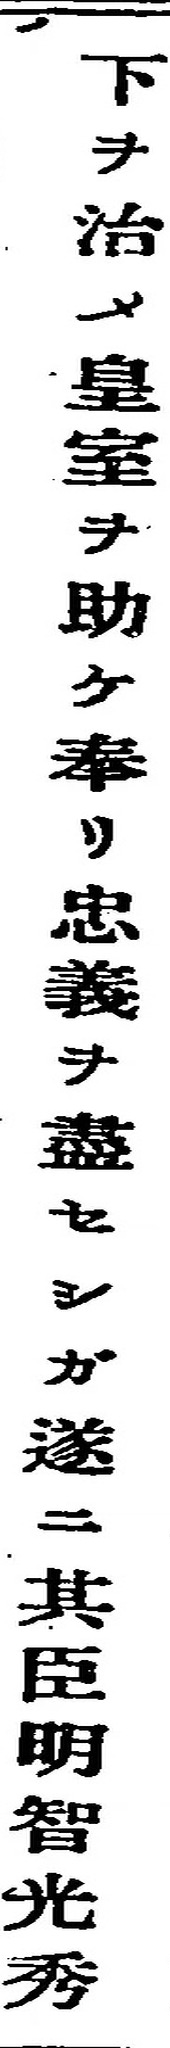下ヲ治メ皇室ヲ助ケ奉リ忠義ヲ盡セシガ遂ニ其臣明智光秀
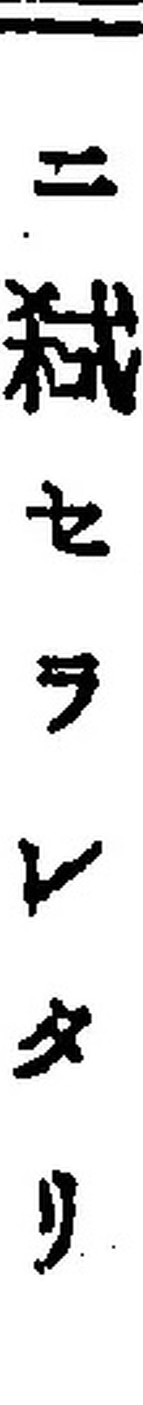ニ弑セラレタリ
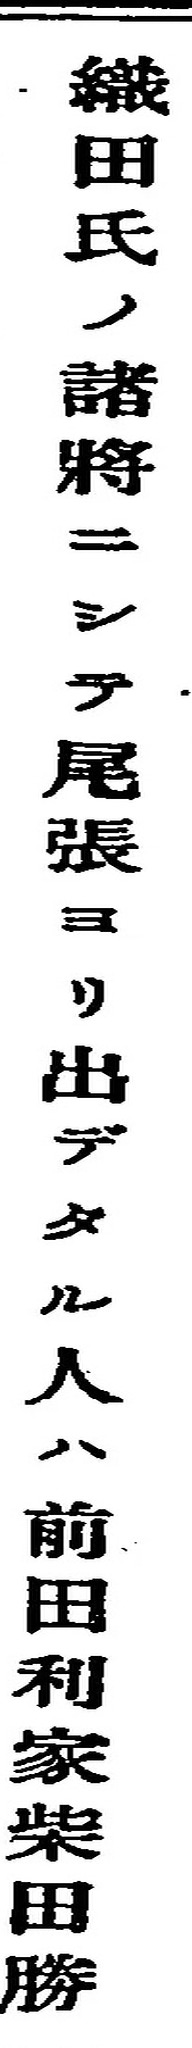織田氏ノ織田氏ノ諸將ニシテ尾張ヨリ出デタル人ハ前田利家柴田勝
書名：郷土誌
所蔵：国立国会図書館 National Diet Library, JAPAN
